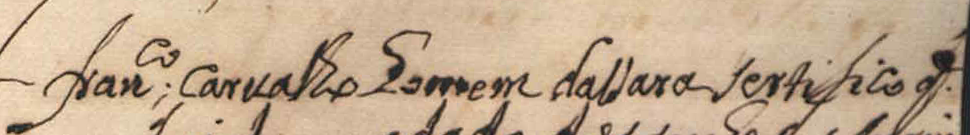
Franco carualho homem da Vara sertifico q̄
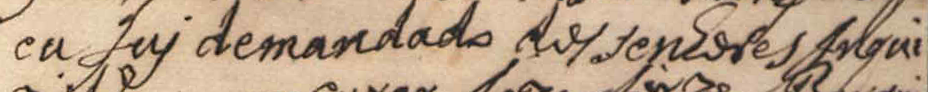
eu fuj demandado dos senhores Jnqui
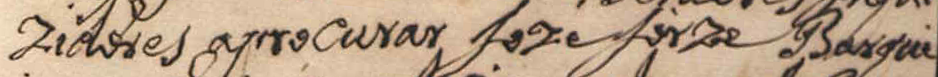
zidores a procurar Joze Jorze Barque
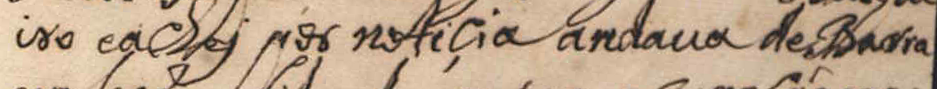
iro, e achej por noticia andaua de Barra
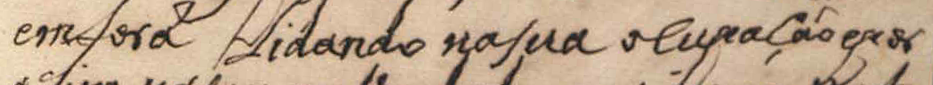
em fora Lidando na sua ocupaÇaõ e por
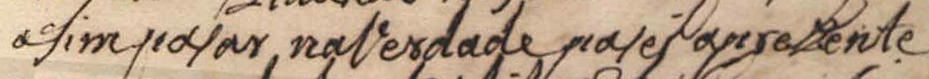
asim pasar na Verdade pasej a prezente
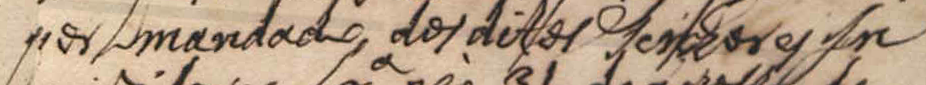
por mandado, dos ditos senhores Jn
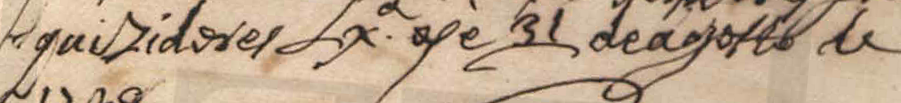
quizidores Lx.a oje 31 de agosto de
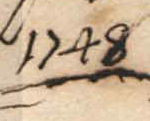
1748
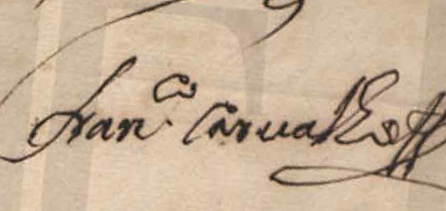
Fran.co Carualho
